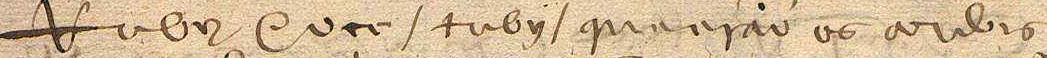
Ruby e oçe / tuby / que erão os cordoes
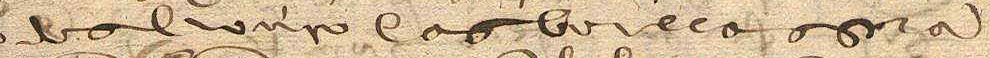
todos de ouro e as borllas serā
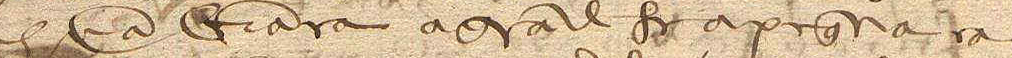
a huā brāca a grāde he a peq̄na car
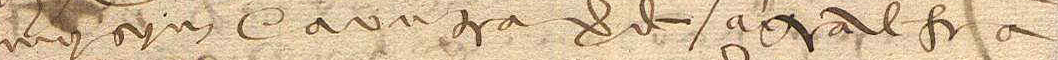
mysym e a outra ꝟde / a grāde he a
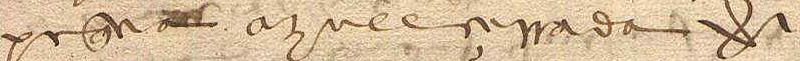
peq̄na azull cerrada
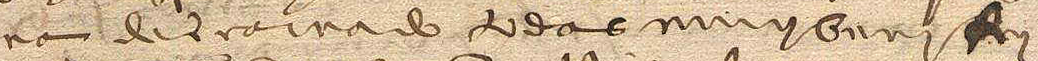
na de ēcarnado todas muy bem fey
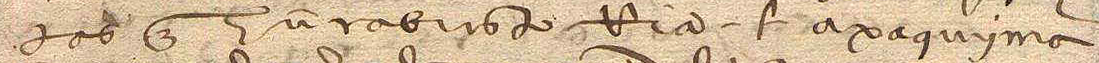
tas item hū cabresto Riā .s. a xaquyma
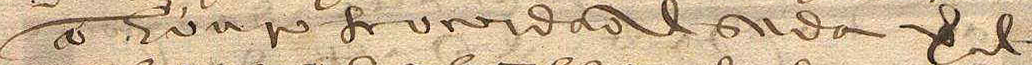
c̄o houro he o cordaõ de seda ꝟde
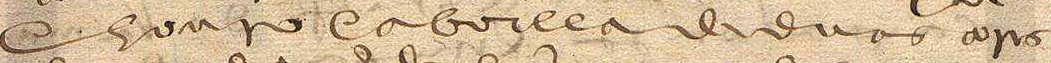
e houro e a borlla de duas cores
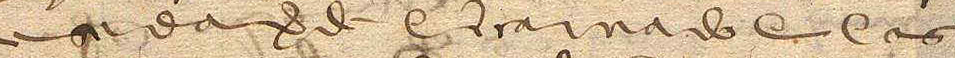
de seda ꝟde e ēcarnado e e as
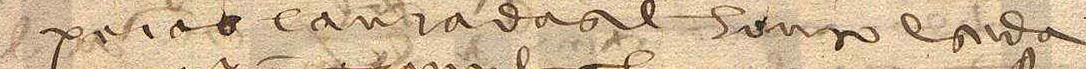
peias lauradas de houro e seda
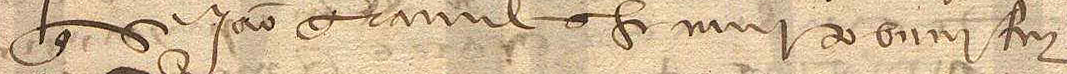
q̄ seJaõ gramdes he mujto bem fey
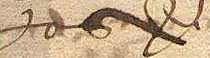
tas
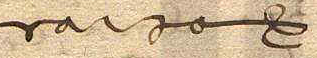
carta
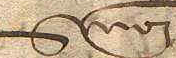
Sn̄or
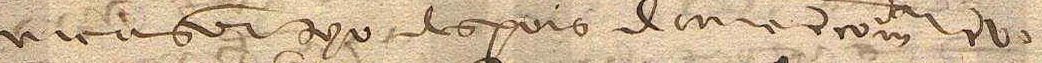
meu sōr tyo despois de me ēcomdar ē vo
